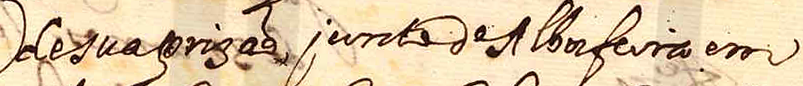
de sua prizaõ junto de Albufeira em
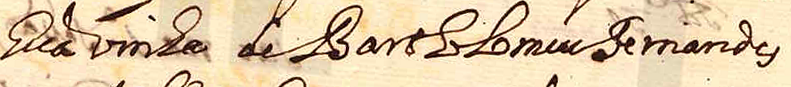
huā vinha de Bartholomeo Fernandes
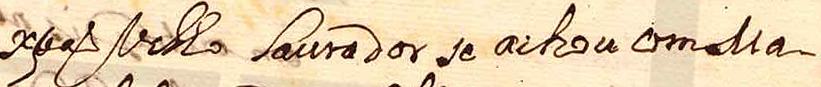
xpaõ Velho lavrador se achou com Ma
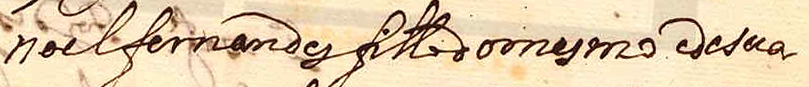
noel fernandes filho do mesmo e de sua
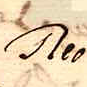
Reo
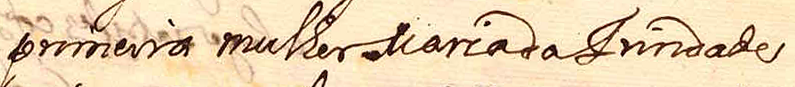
primeira mulher Maria da Trindade
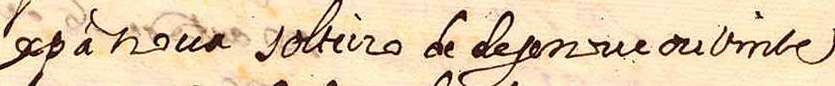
xpa noua solteiro de dezenoue ou uinte
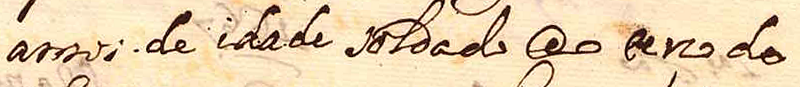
annos de idade soldado do terço do
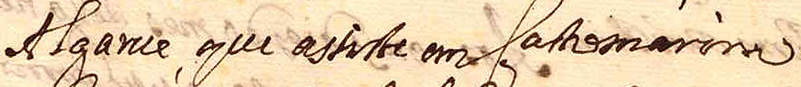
Algarve, que assiste em Castro marim
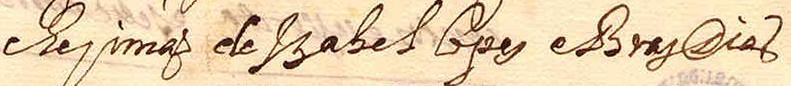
e he jrmaõ de Jzabel lopes e Bras Dias
